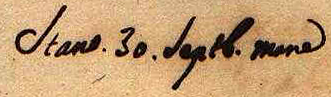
Stano. 30. septb. mane
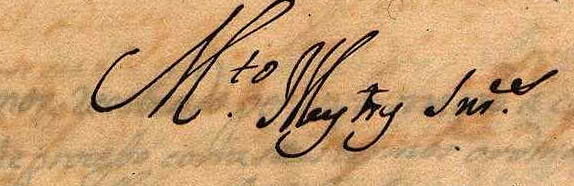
M.to Illustres Snr.es
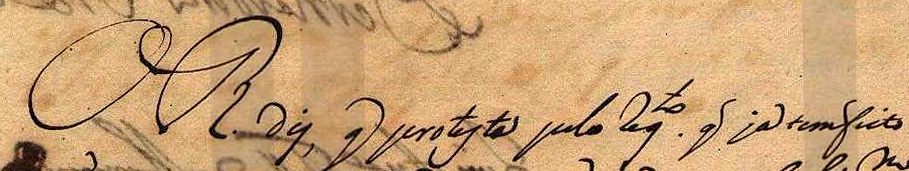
O R. dis, q̄ protesta pelo Req.to q̄ já tem feito
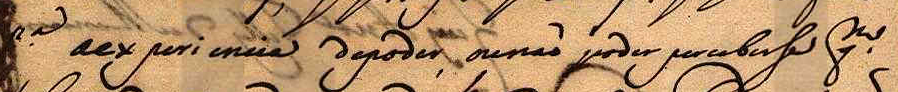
n.a experiencia de poder, ou naõ poder perceberse q.m
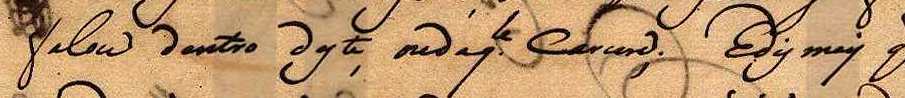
falou dentro deste, ou daq.le Carcere; E dis mais q̄
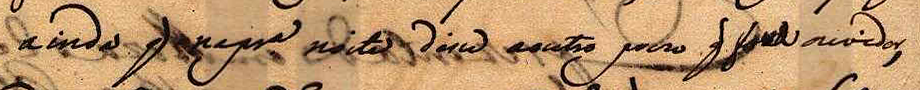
ainda q̄ na pr.a noite disse a outro prezo q̄ fora ouvidor,
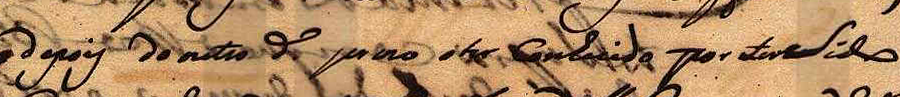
depois do outro d.o prezo o ter Conhecido por ter sido
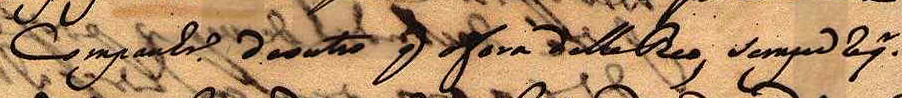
Companhr.o do outro q̄ o fora delle Reo, sempre Req.r
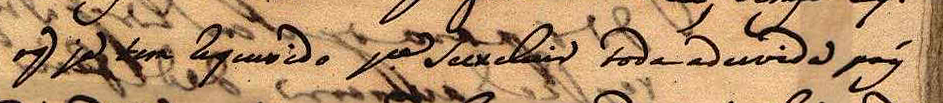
o q̄ ja tem Requerido p.a se excluir toda a duvida pois
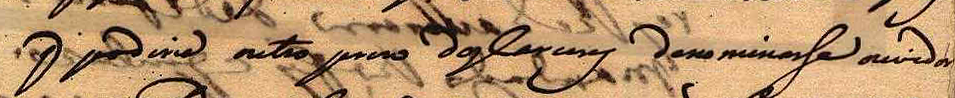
q̄ poderia outro prezo dos Careeres denominarse ouvidor
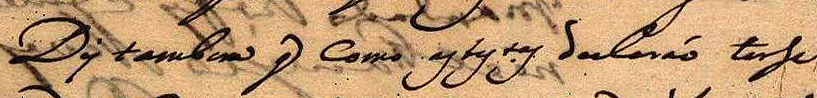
Dis tambem q̄ como as testas declaraõ terse
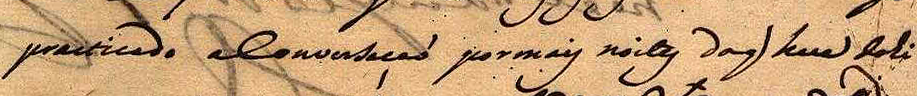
practicado a Conversaçaõ por mais noites do q̄ teue dahi
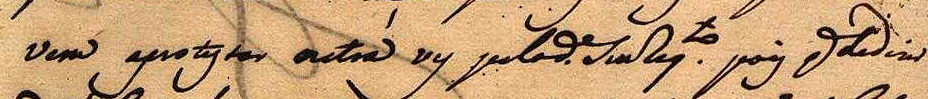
vem a protestar outra ves pelo d.o seu Req.to pois q̄ se dizer
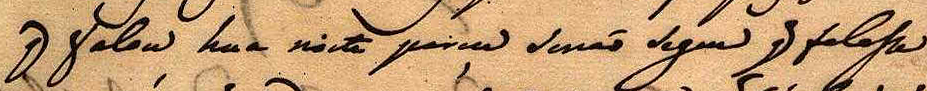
q̄ falou hua noite parece senaõ segue q̄ falasse
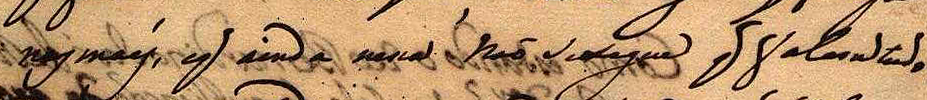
nas máes, e q̄ ainda nessa naõ se segue q̄ falara tudo
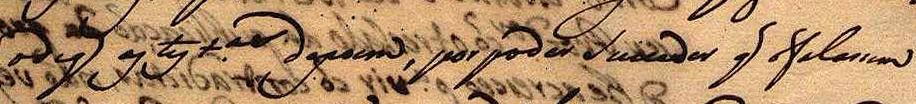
o de q̄ as test.as depoem, por poder succeder q̄ o falassem
